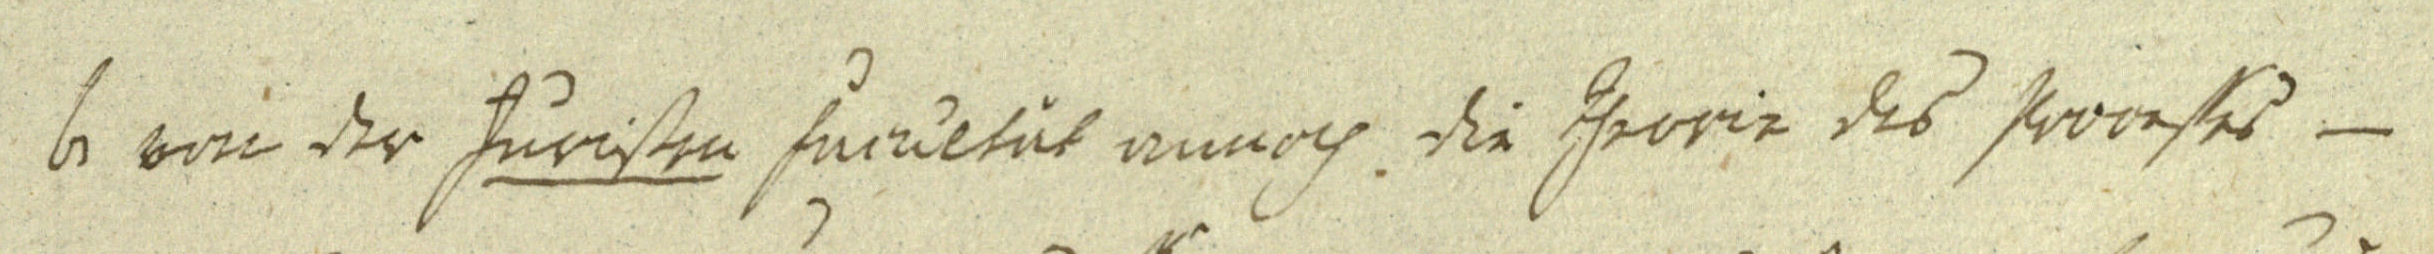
b. von der Juristen Facultät annoch die Theorie des Processes -
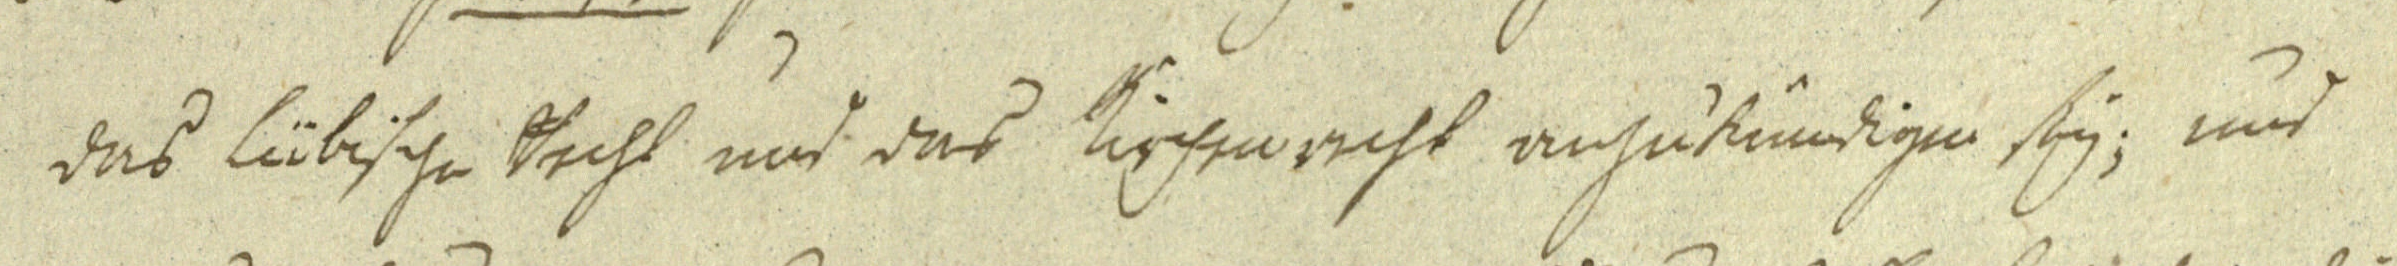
das lübische Recht und das Kirchenrecht anzukündigen seÿ; und
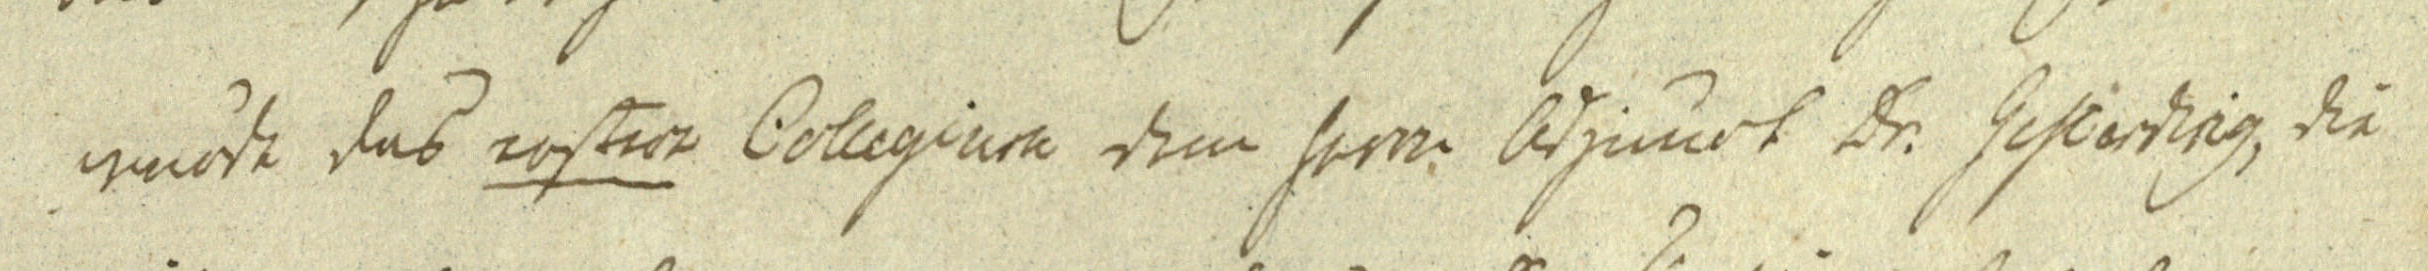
würde das erstere Collegium dem Herrn Adjunct Dr. Gesterding, die
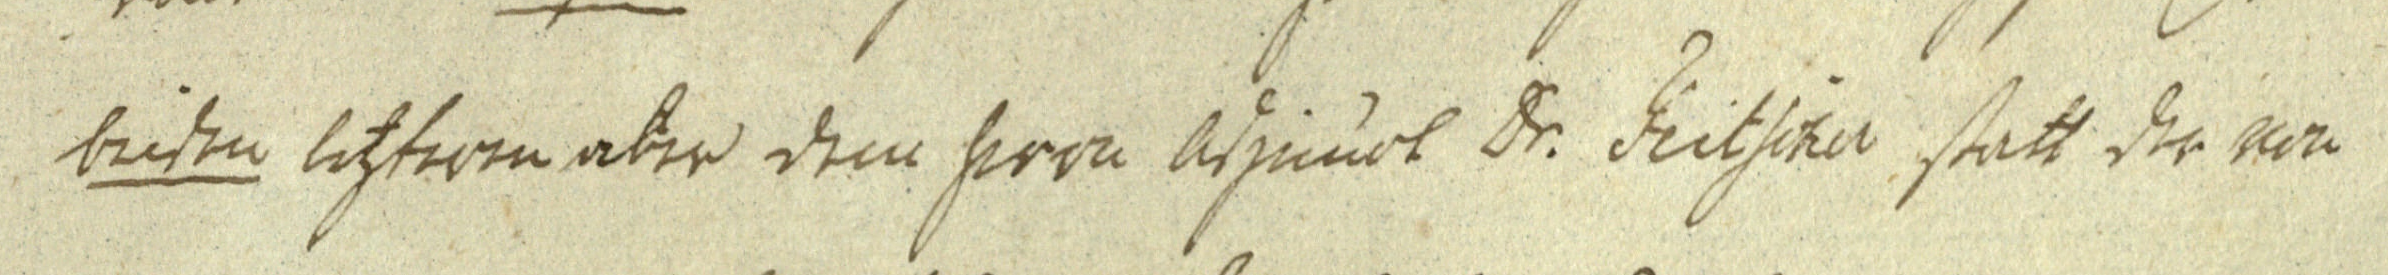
beiden letzteren aber dem Herrn Adjunct Dr. Feitscher statt der von
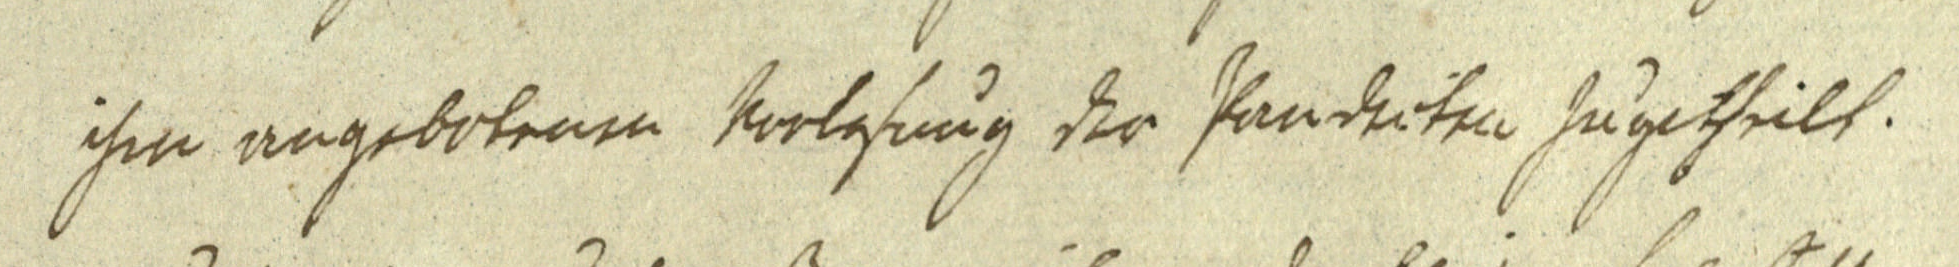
ihm angebotenen Vorlesung der Pandecten zugetheilt.
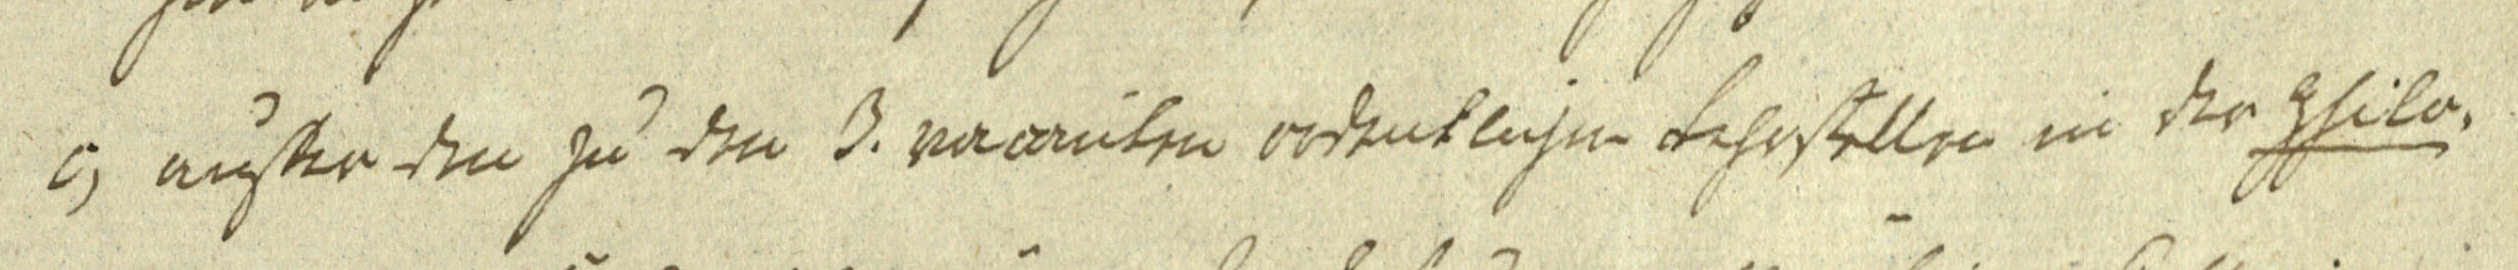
c, ausser den zu den 3. vacanten ordentlichen Lehrstellen in der philo¬
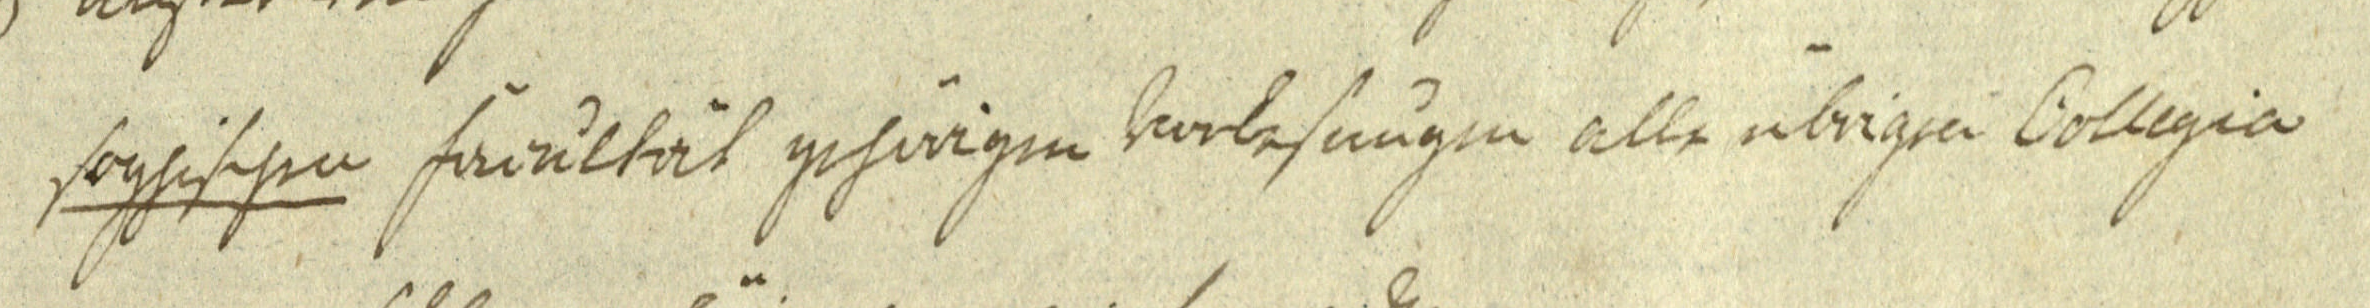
sophischen Facultät gehörigen Vorlesungen alle übrigen Collegia
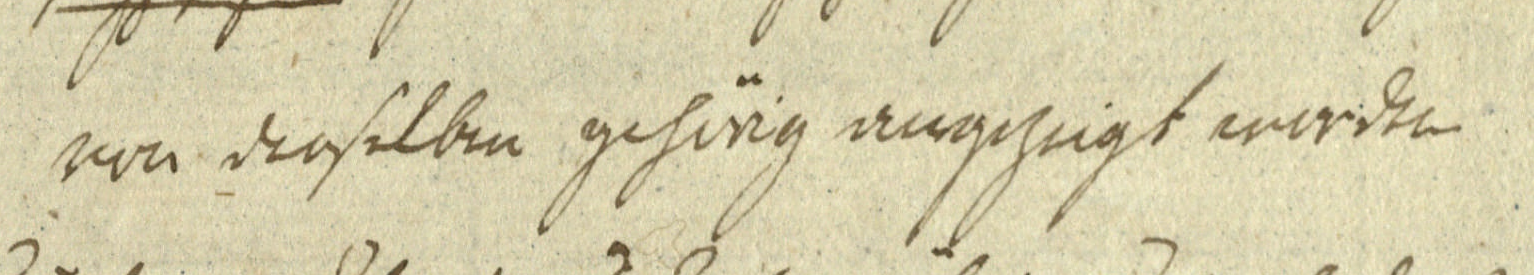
von derselben gehörig angezeigt worden
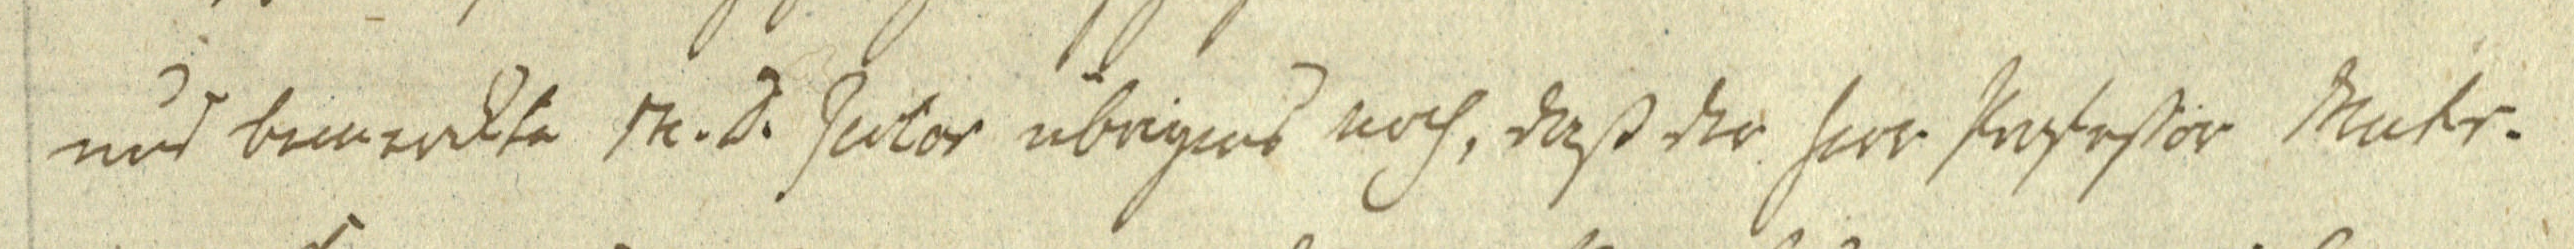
und bemerkte M. D. Rector übrigens noch, daß der Herr Professor Muhr¬
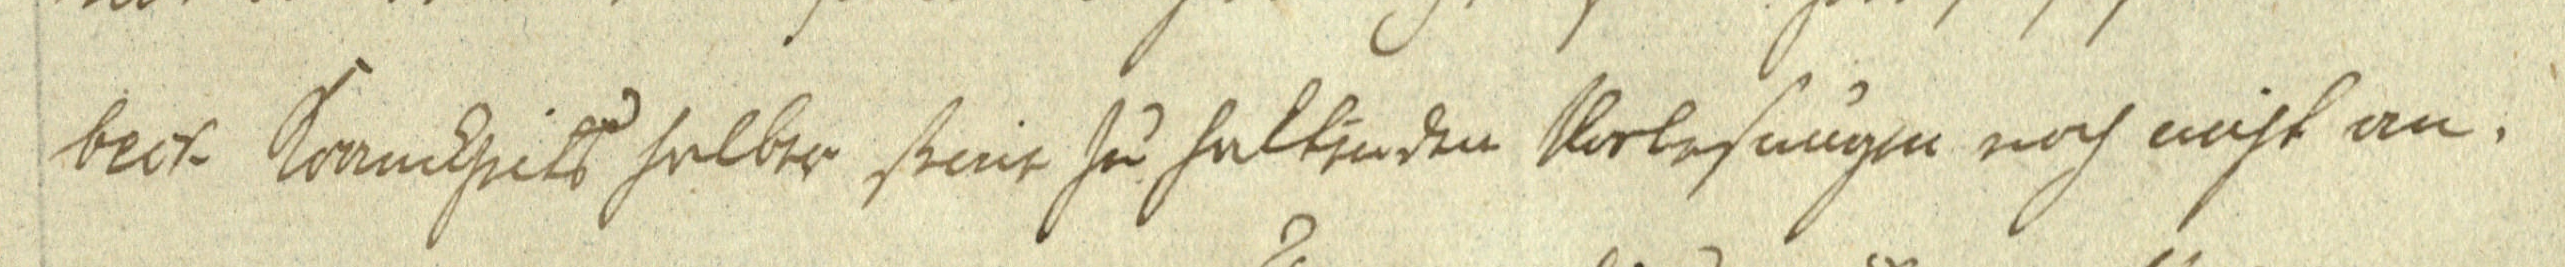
beck Krankheits halber seine zu haltenden Vorlesungen noch nicht an¬
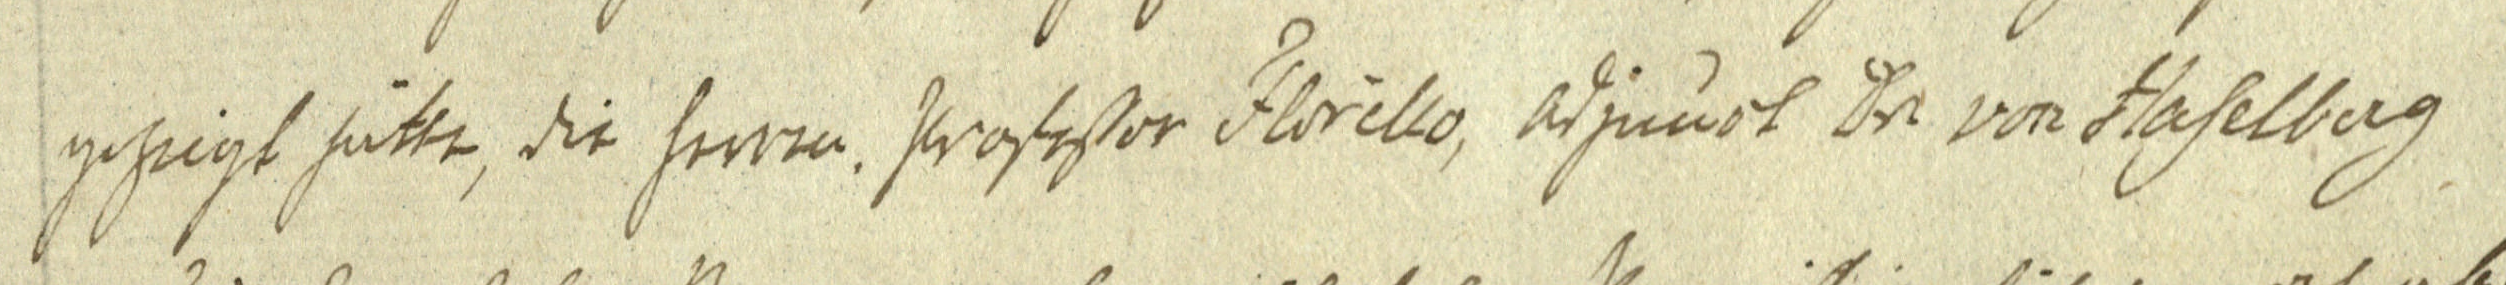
gezeigt hätte, die Herren, Professor Florello, Adjunct Dr. von Haselberg
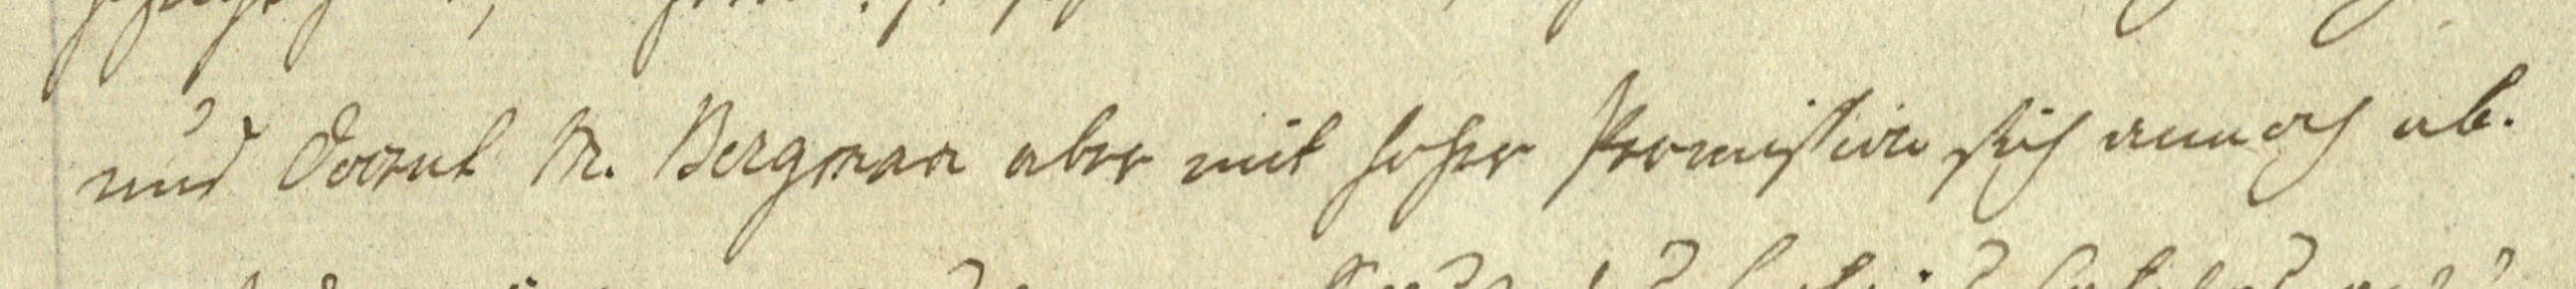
und Docent M. Bergman aber mit hoher Permission sich annoch ab¬
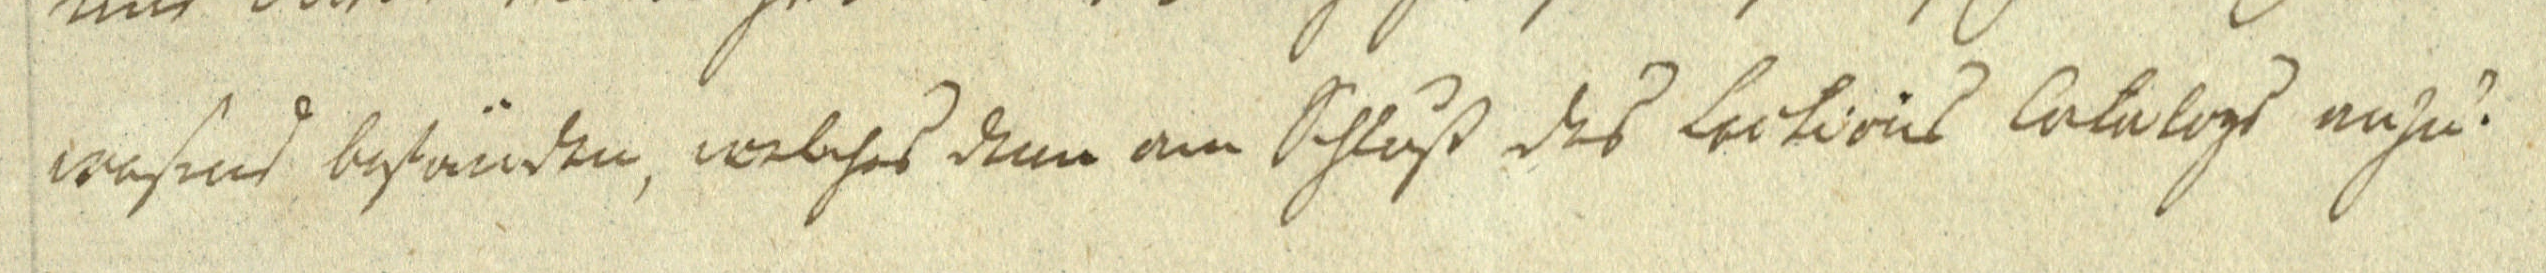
wesend befänden, welches denn am Schluß des Lections Catalogs anzu¬
